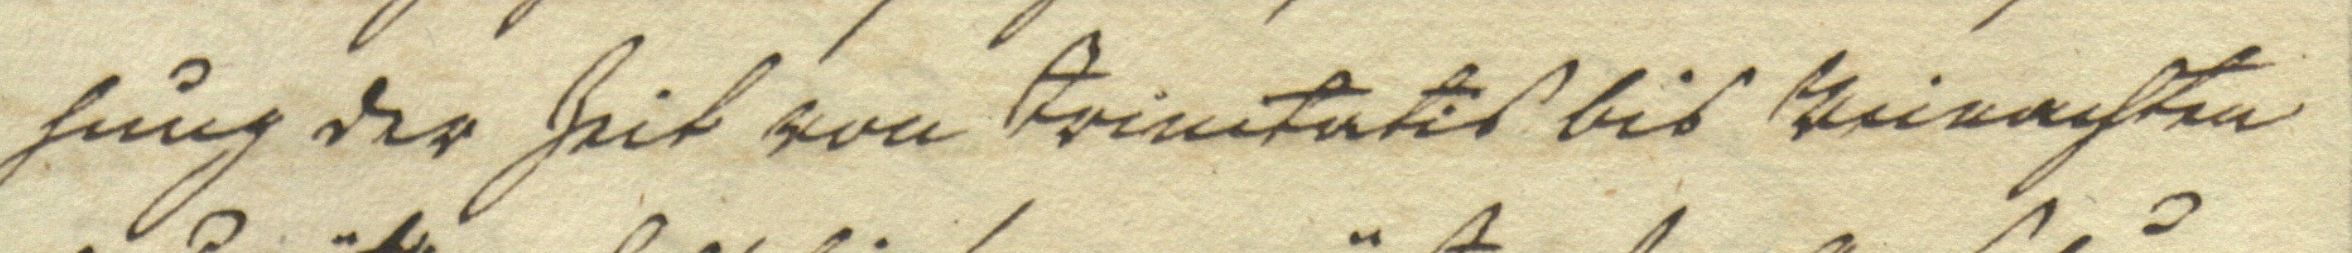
lung der Zeit von Trinitatis bis Weinachten
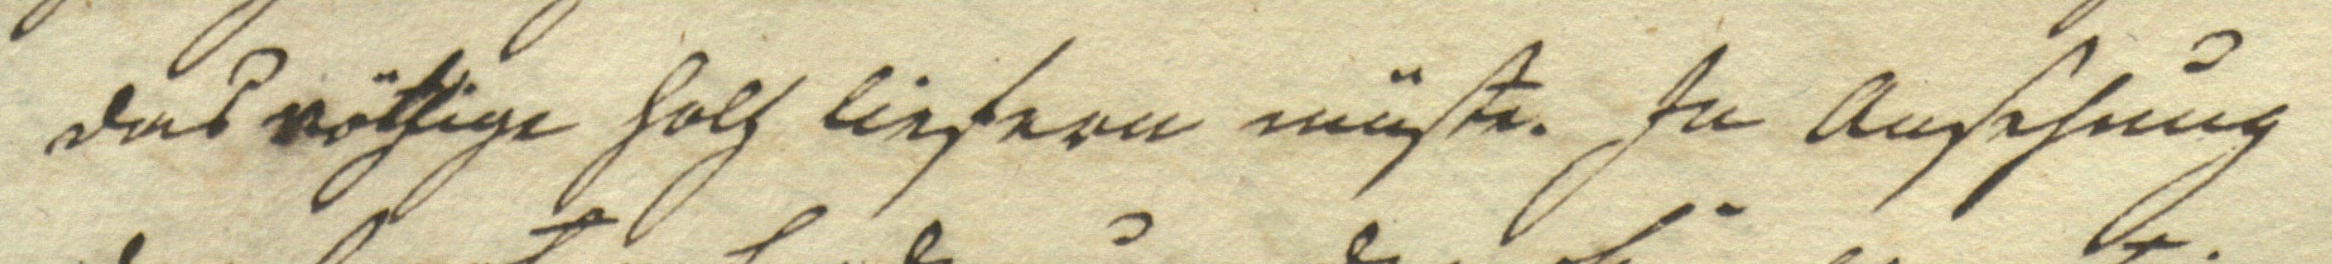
das nöthige Holz liefern müßte. In Ansehung
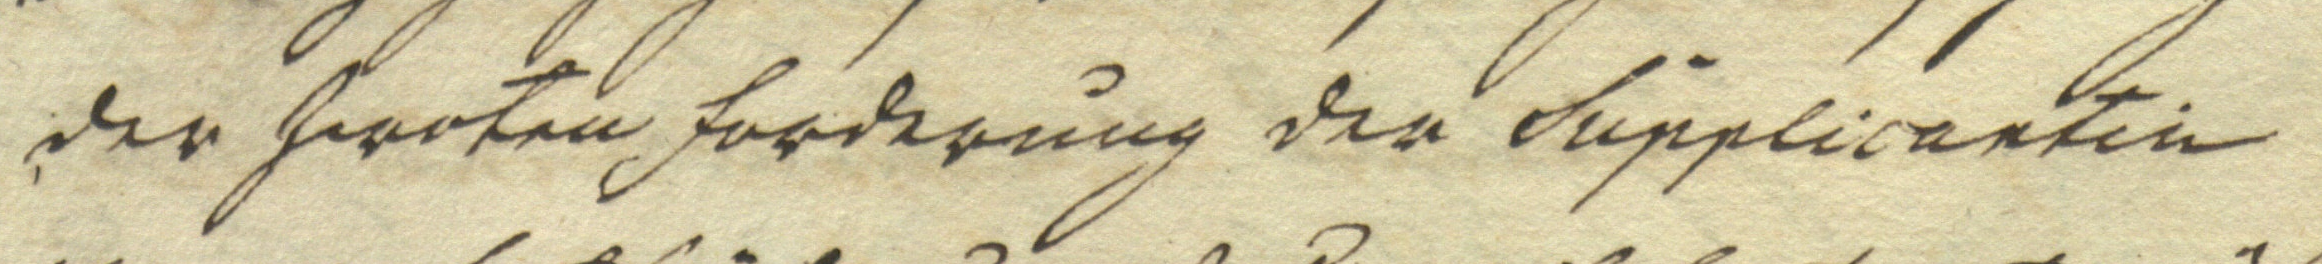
der zwoten Forderung der Supplicantin
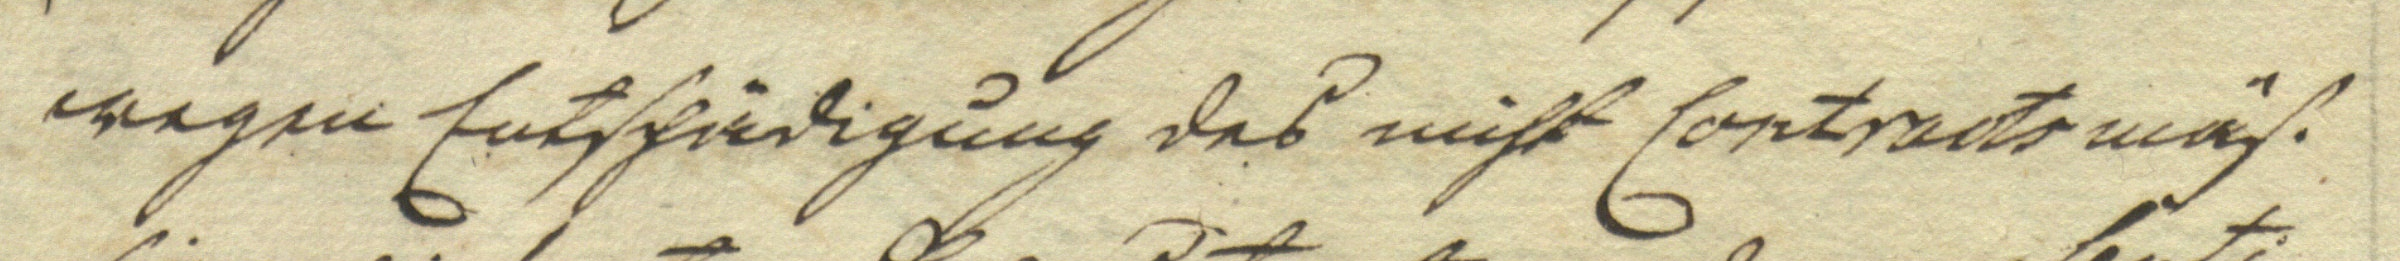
wegen Entschädigung des nicht Contractsmäs¬
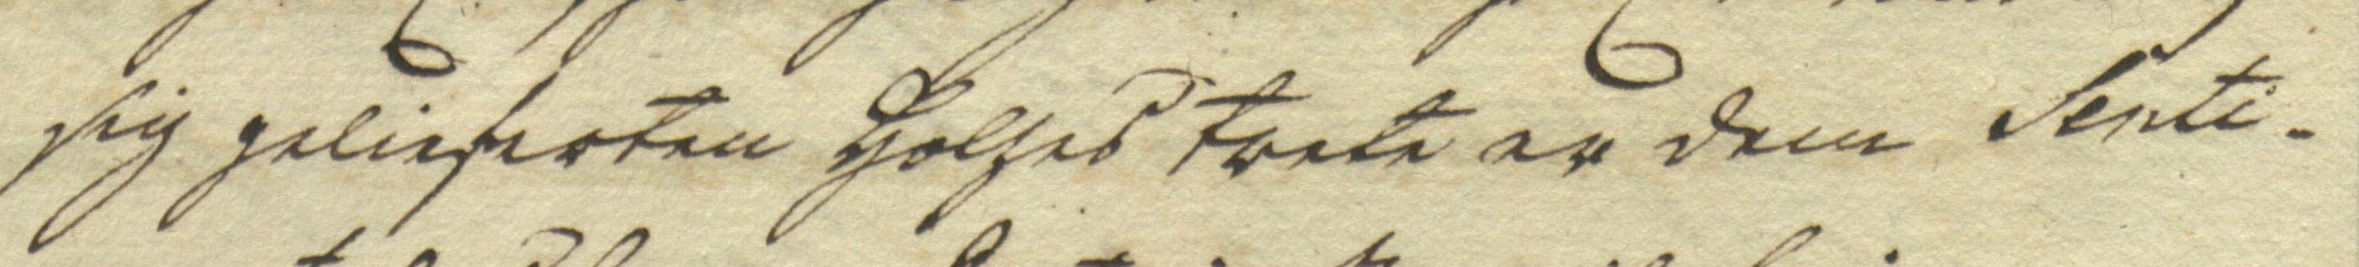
sig gelieferten Holzes trete er dem Senti¬
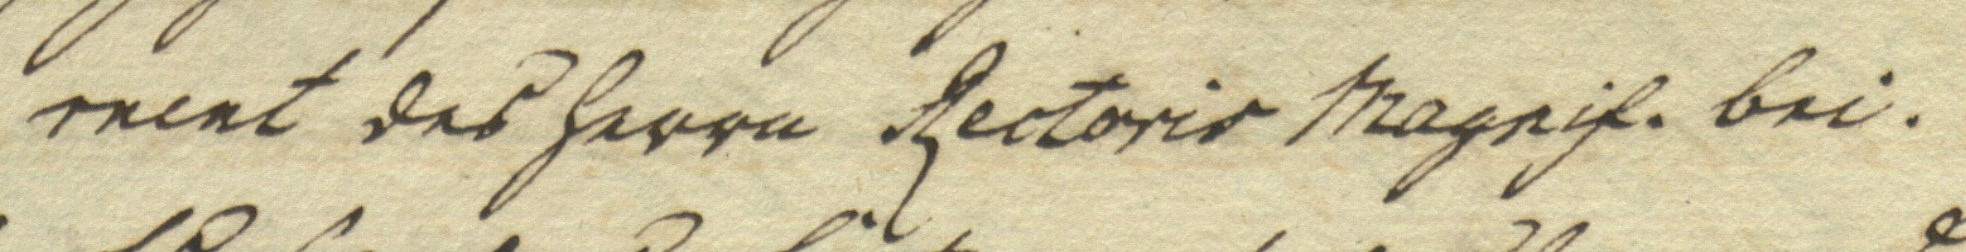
ment des Herrn Rectoris Magnif. bei.
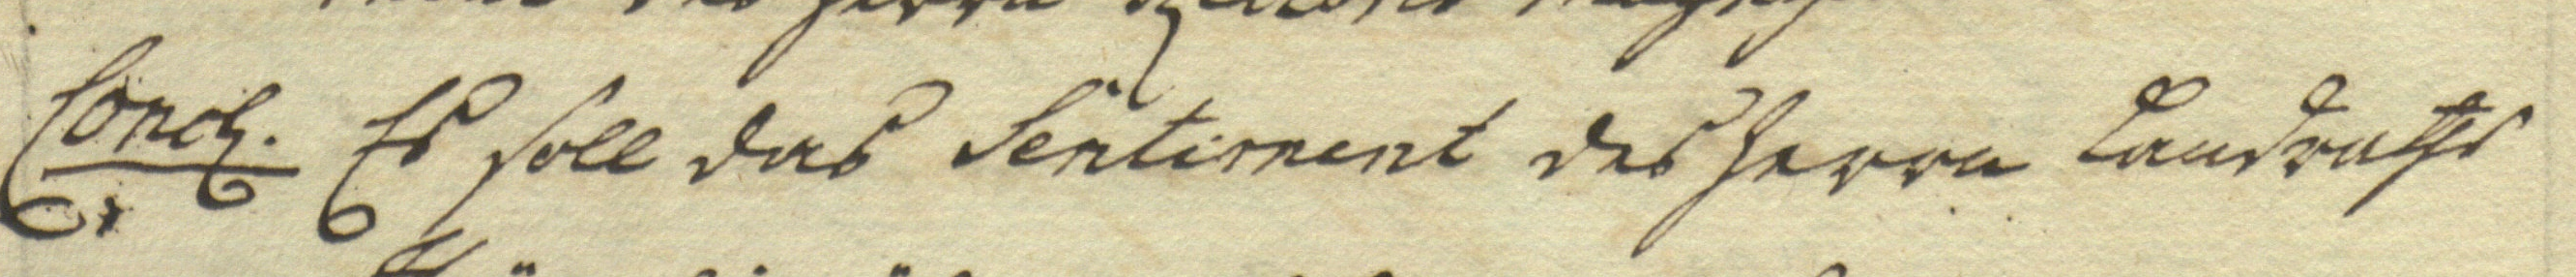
Concl. Es soll das Sentiment des Herrn Landraths
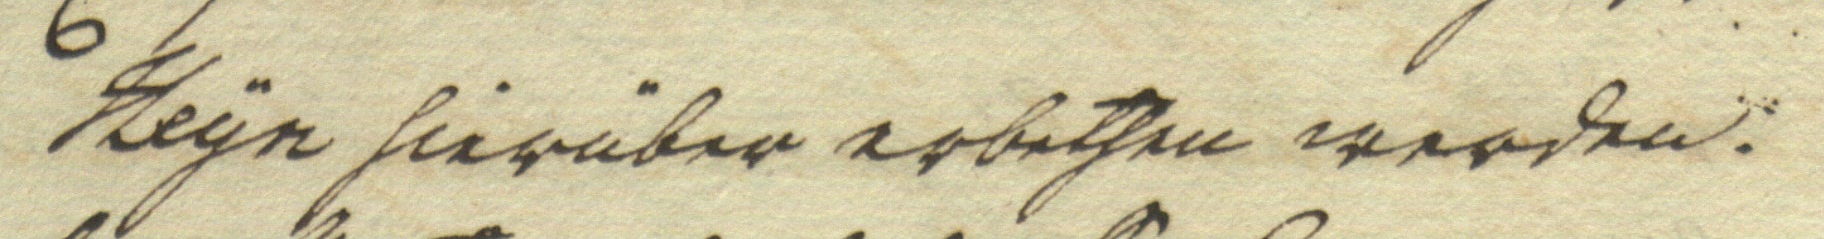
Heÿn hierüber erbethen werden.
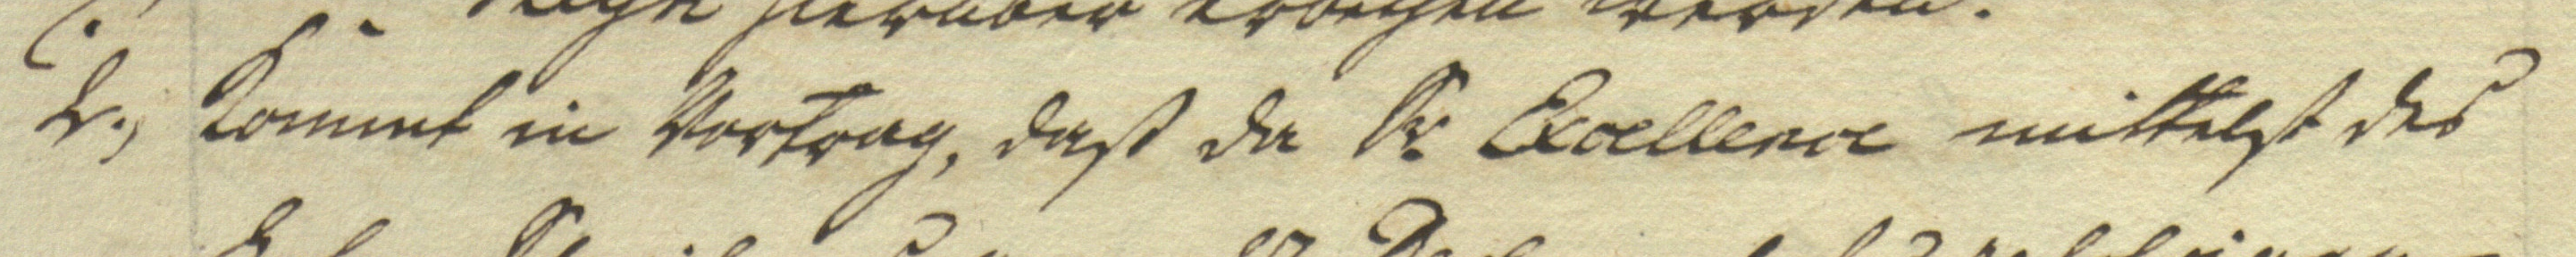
2., Kommt in Vortrag, daß da Sr Excellence mittelst des
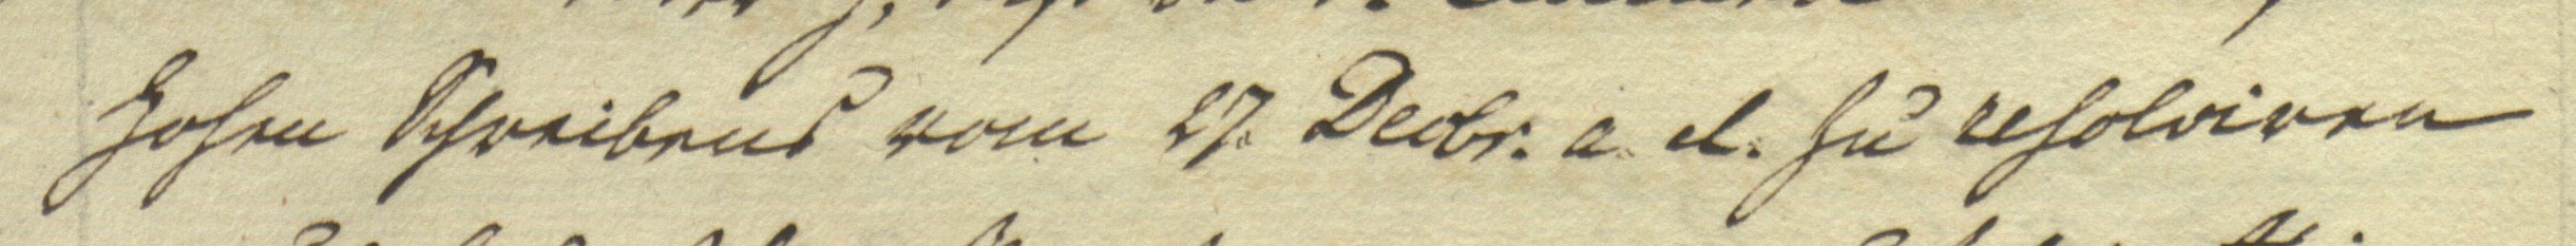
Hohen Schreibens vom 27. Decbr. a. el. zu resolviren
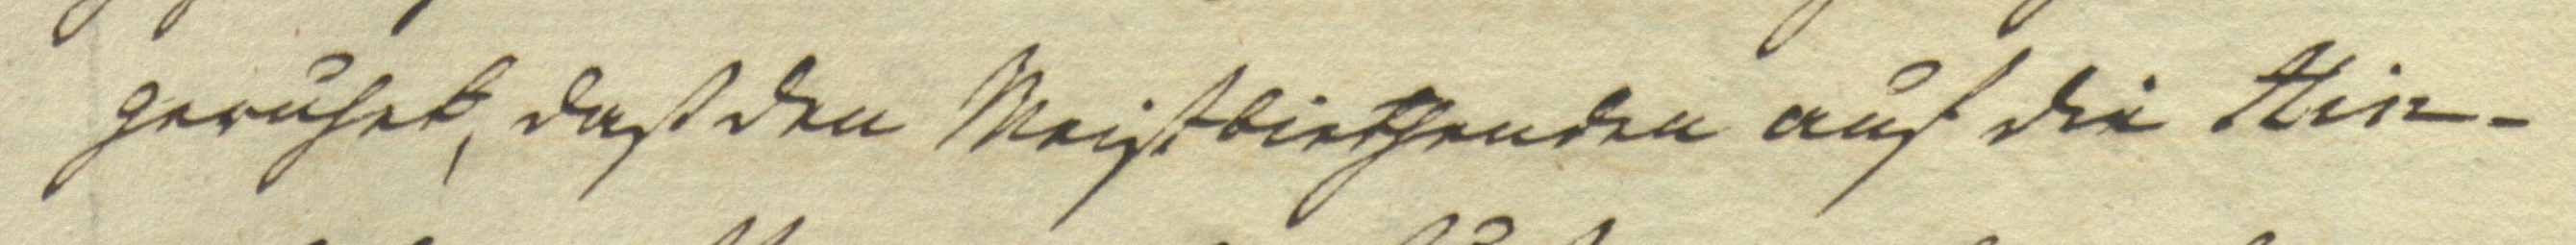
geruhet, daß den Meistbiethenden auf die Hin¬
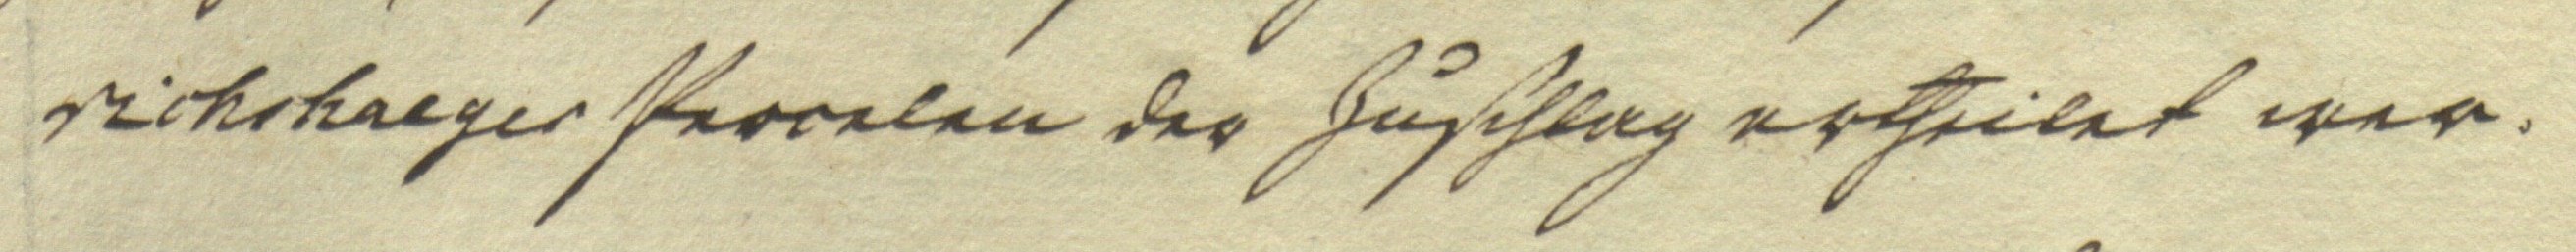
richshaeger Percelen der Zuschlag ertheilet wer¬
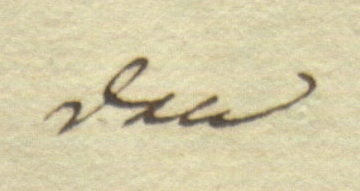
den
